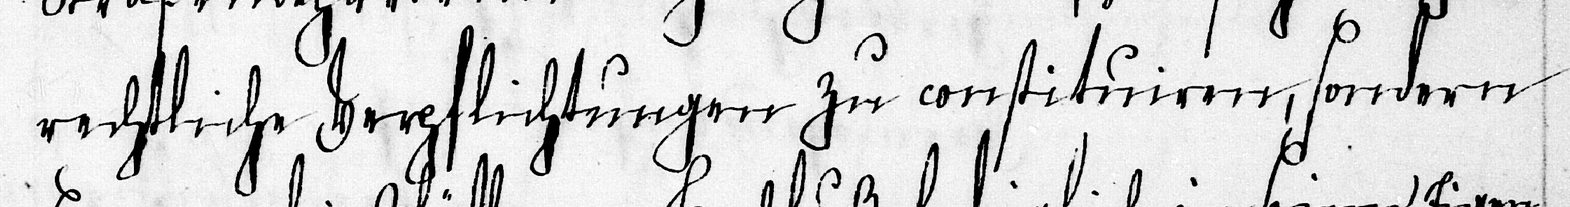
rechtliche Verpflichtungen zu constituiren, sondern
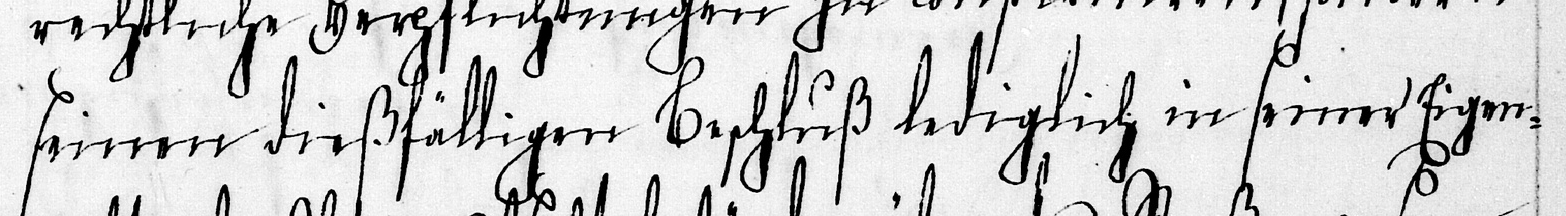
seinen dießfälligen Beschluß lediglich in seiner Eigen¬
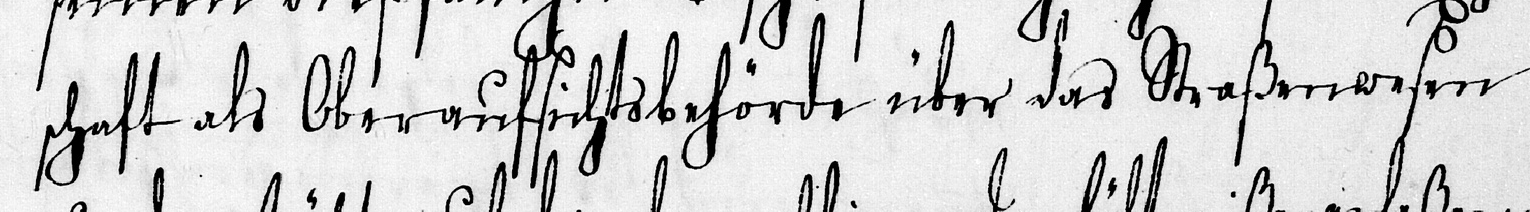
schaft als Oberaufsichtsbehörde über das Straßenwesen
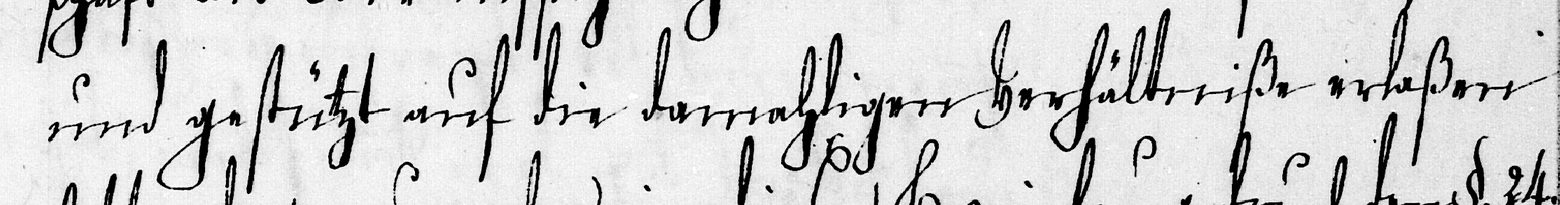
und gestützt auf die damahligen Verhältniße erlaßen
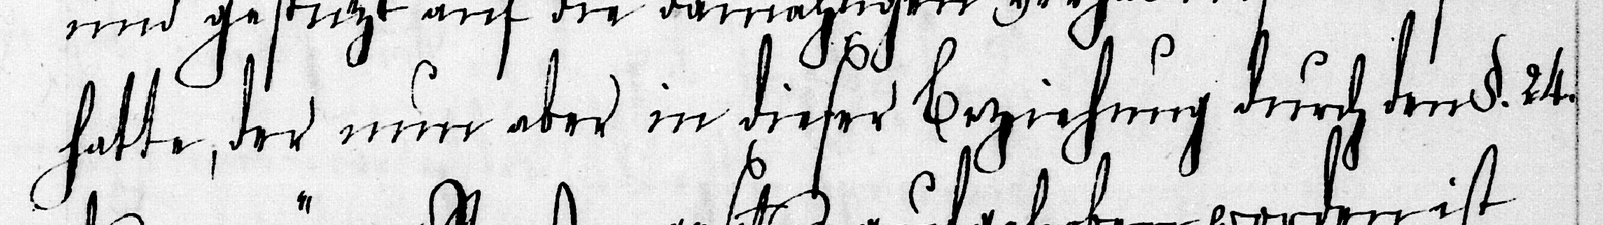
hatte, der nun aber in dieser Beziehung durch den §. 24.
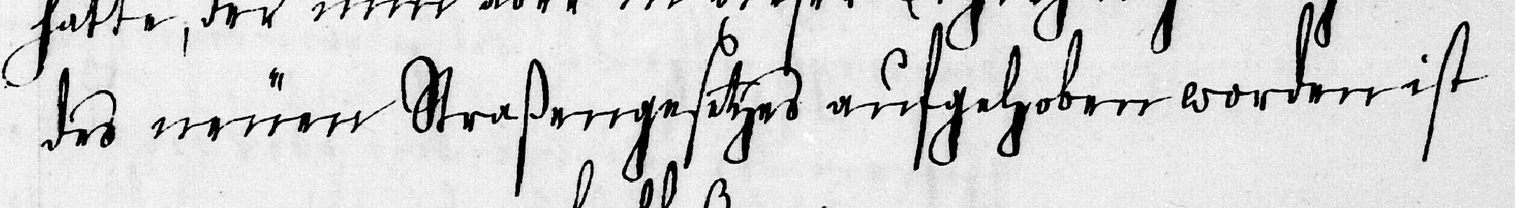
des neuen Straßengesetzes aufgehoben worden ist
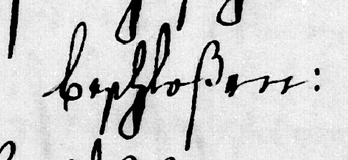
beschloßen:
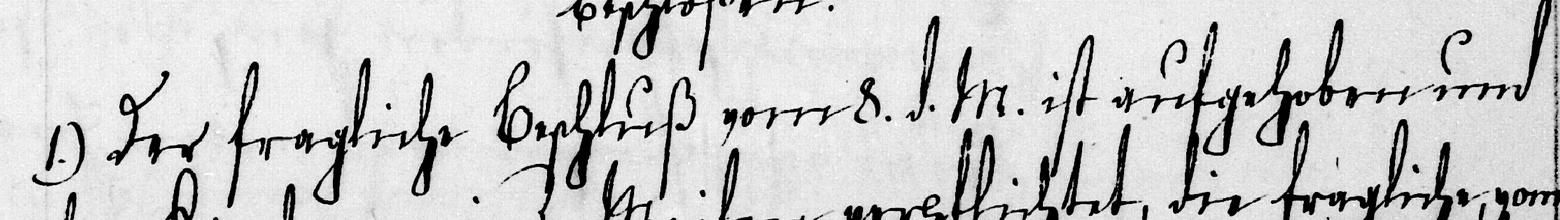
1.) Der fragliche Beschluß vom 8. d. M. ist aufgehoben und
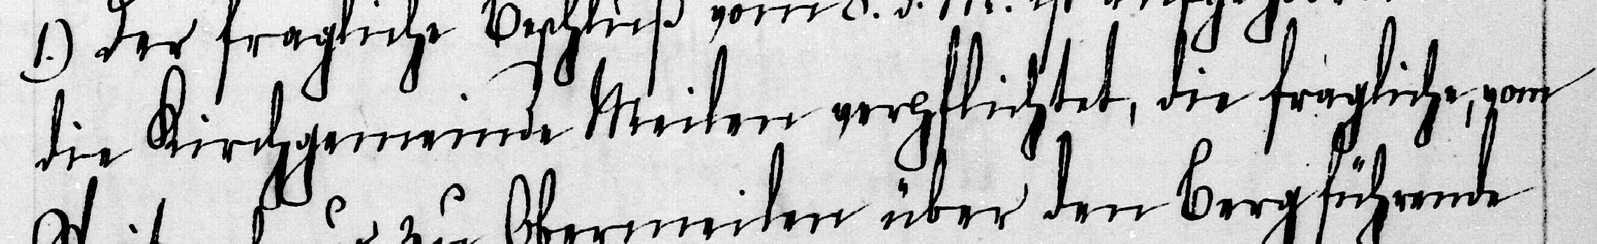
die Kirchgemeinde Meilen verpflichtet, die fragliche, vom
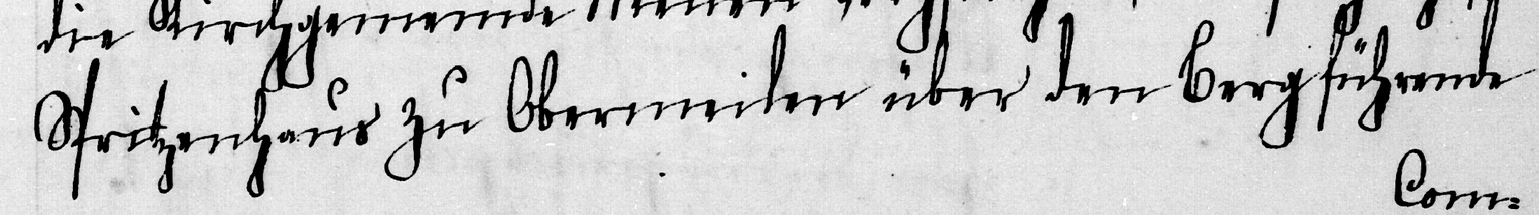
Spritzenhaus zu Obermeilen über den Berg führende
